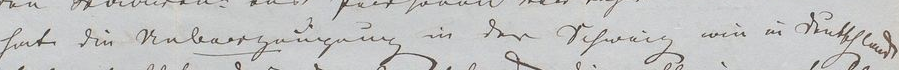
hat die Ueberzeugung in der Schweiz wie in Deutschland
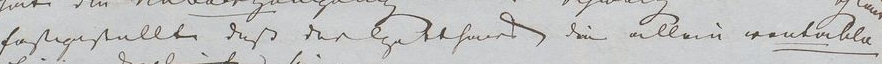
festgestellt daß der Gotthard die allein rentable
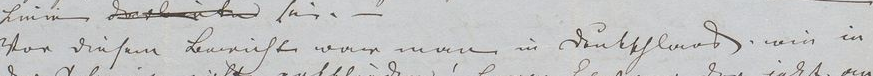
Vor diesem Bericht war man in Deutschland, wie in
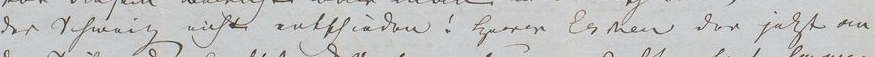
der Schweiz nicht entschieden! Herr Escher der jetzt an
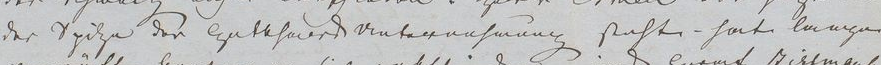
der Spitze der GotthardUnternehmung steht, hat lange
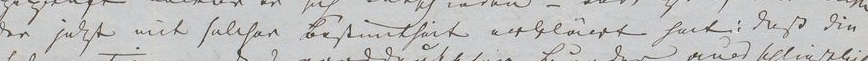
der jetzt mit solcher Bestimmtheit erklärt hat: daß die
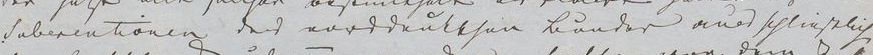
Subventionen der norddeutschen Länder ausschließlich
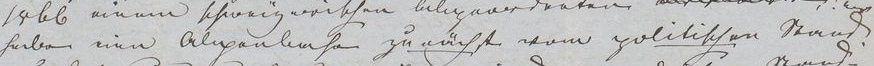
habe eine Alpenbahn zunächst vom politischen Stand-
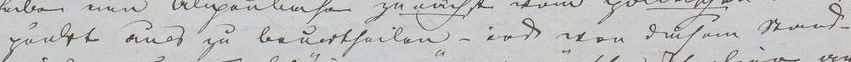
punkt aus zu beurtheilen», und von diesem Stand-
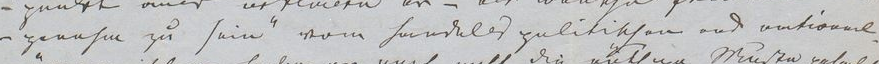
genehm zu sein» vom Handelspolitischen und national-
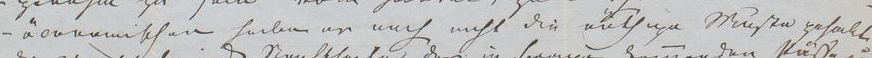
öconomischen habe er noch nicht die nöthige Muße gehabt
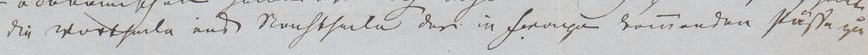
die Vortheile und Nachtheile der in Frage kommenden Pässe zu
